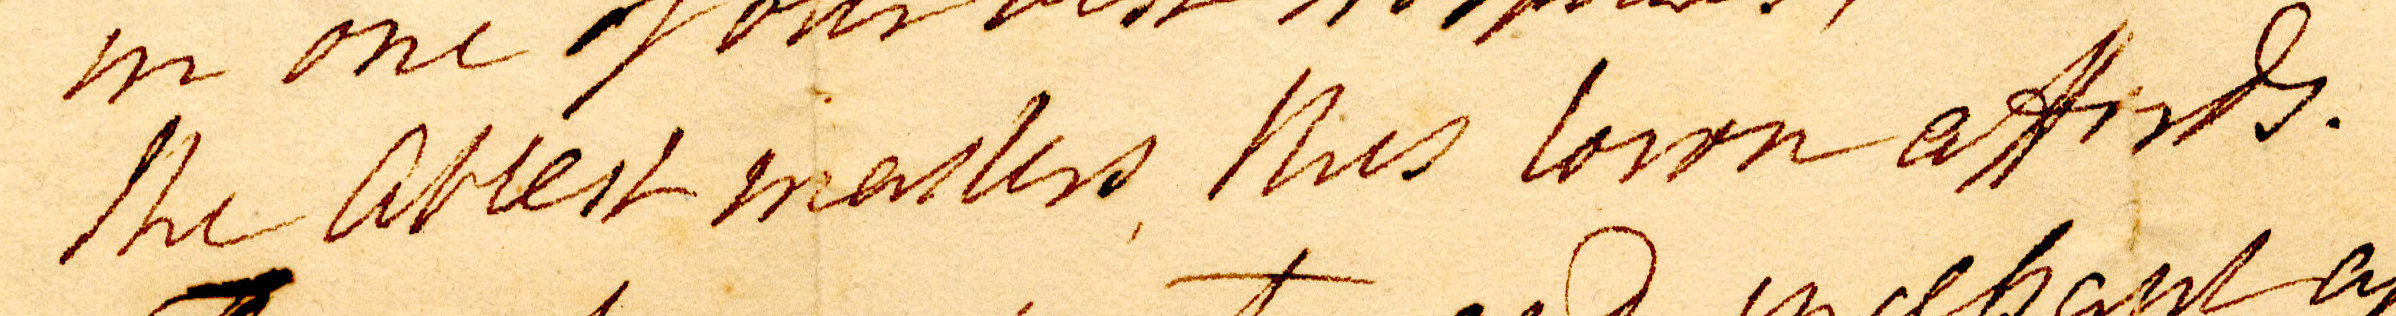the Ablest marks, this town affords.
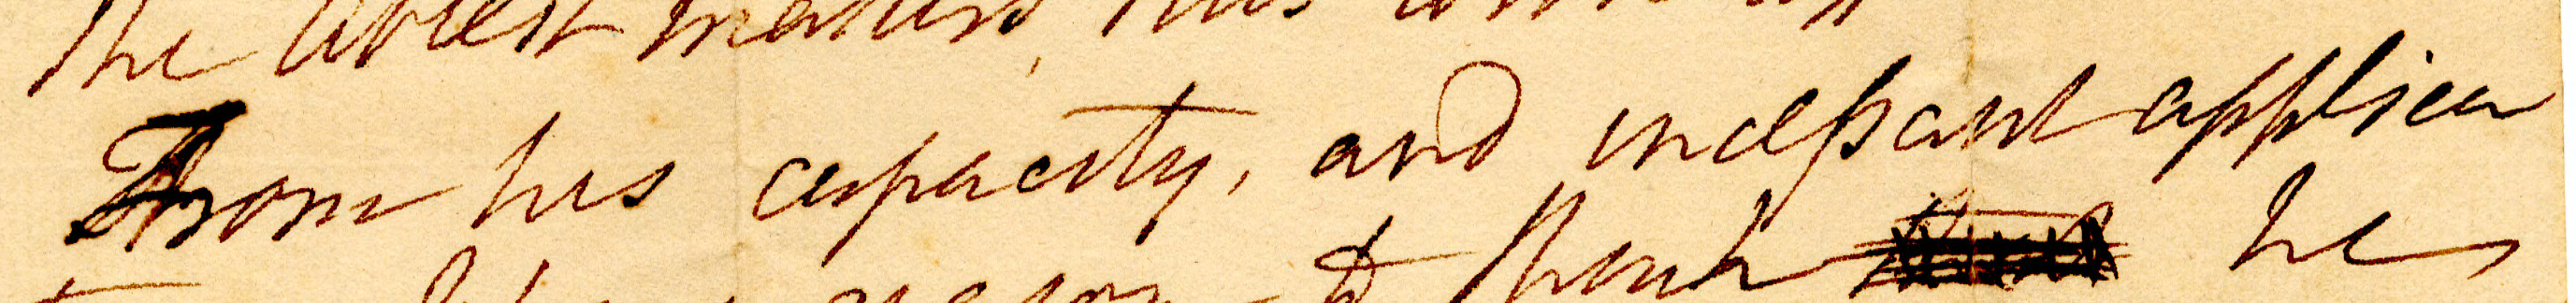From his capacity and incessant applica
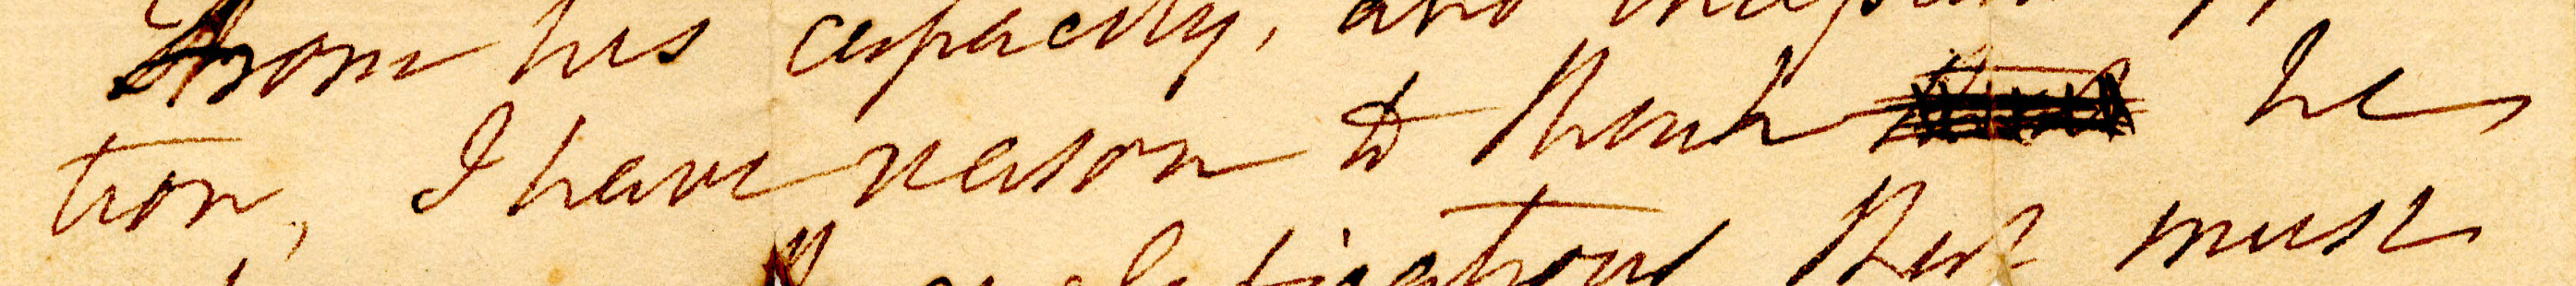tion, I have reason to think [____] he
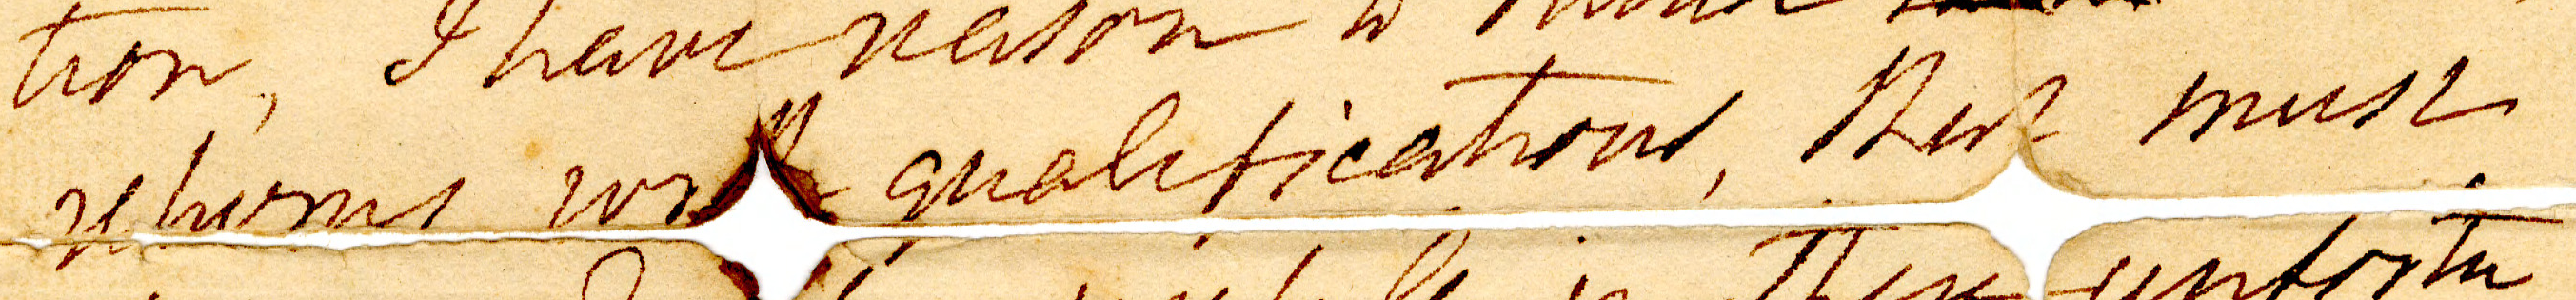returns wi[__] qualifications that must
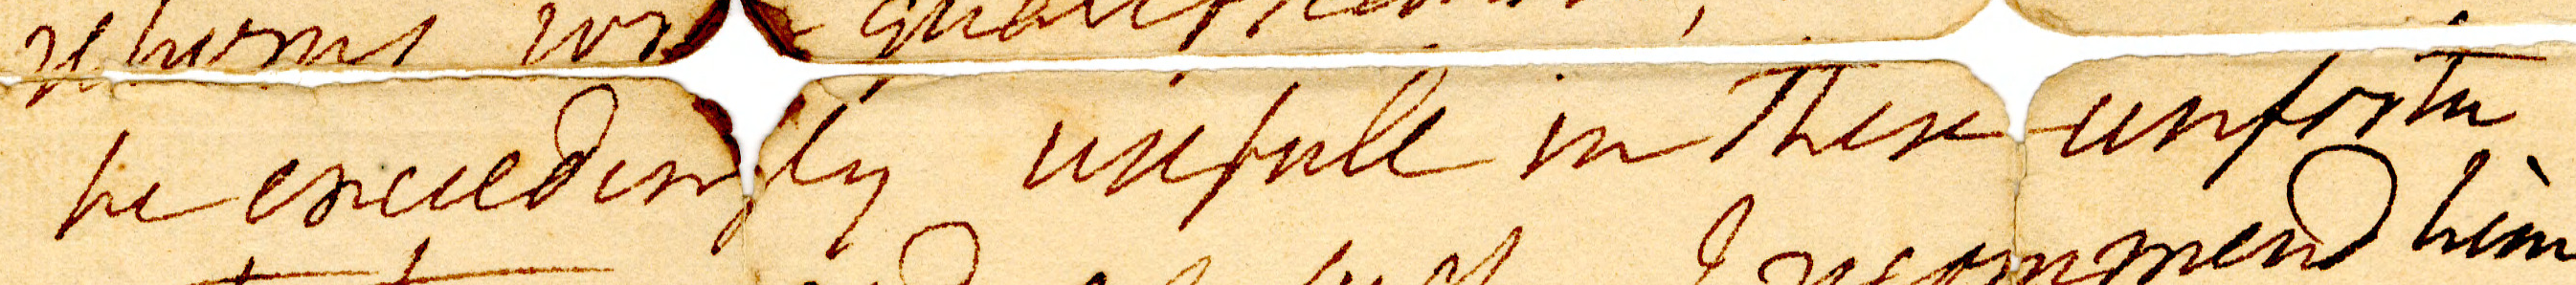be exceedingly useful in these unfortu
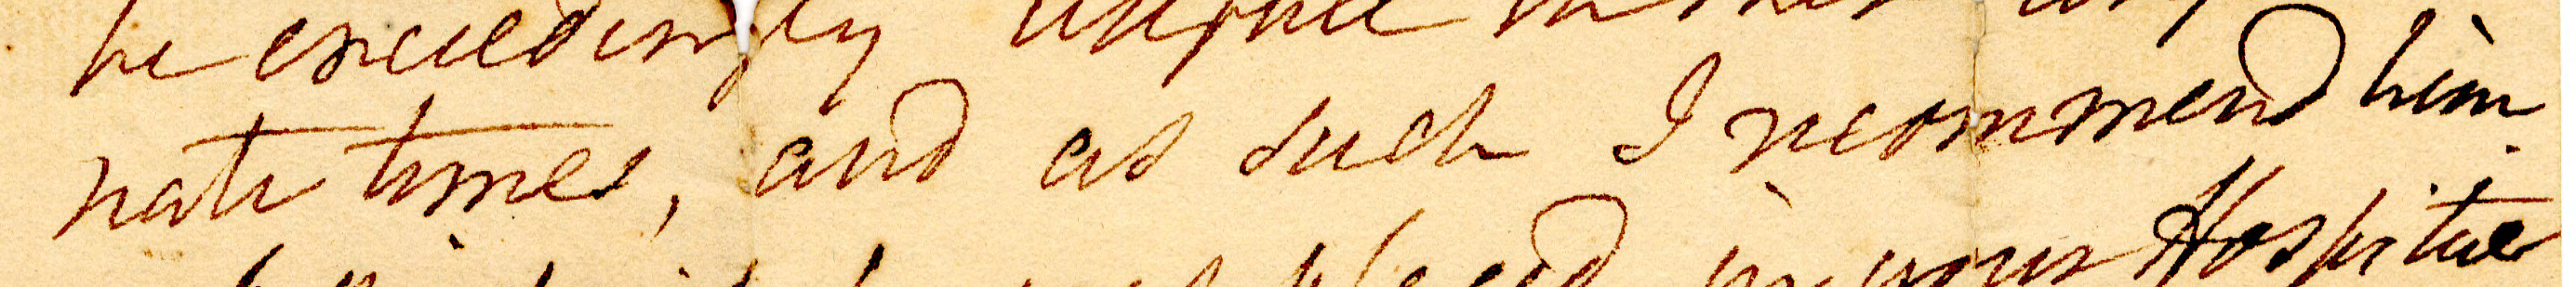nate times, and as such I recommend him
